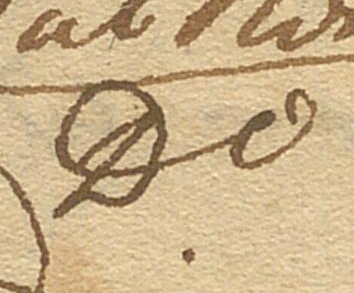D^o.
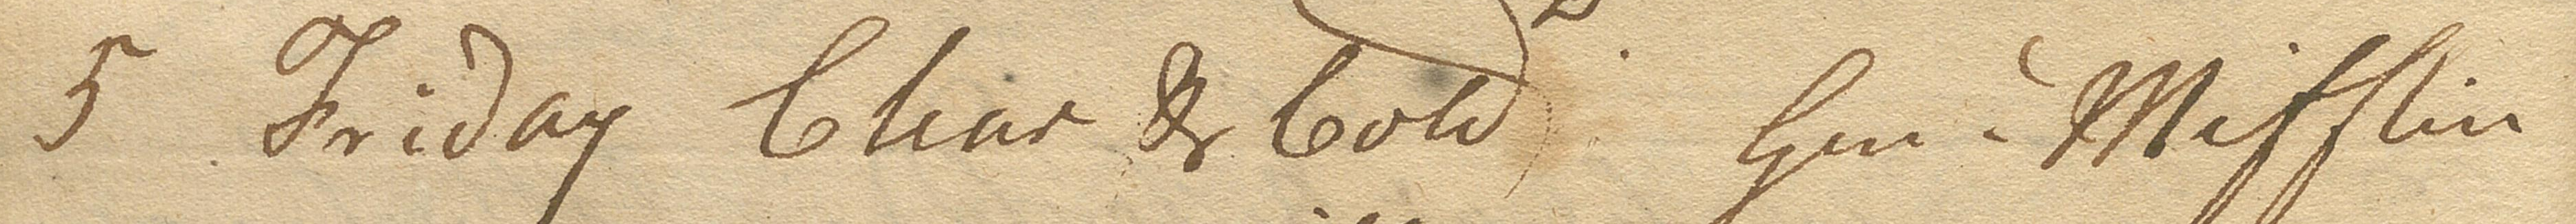5 Friday Clear & Cold. Gen^l. Mifflin
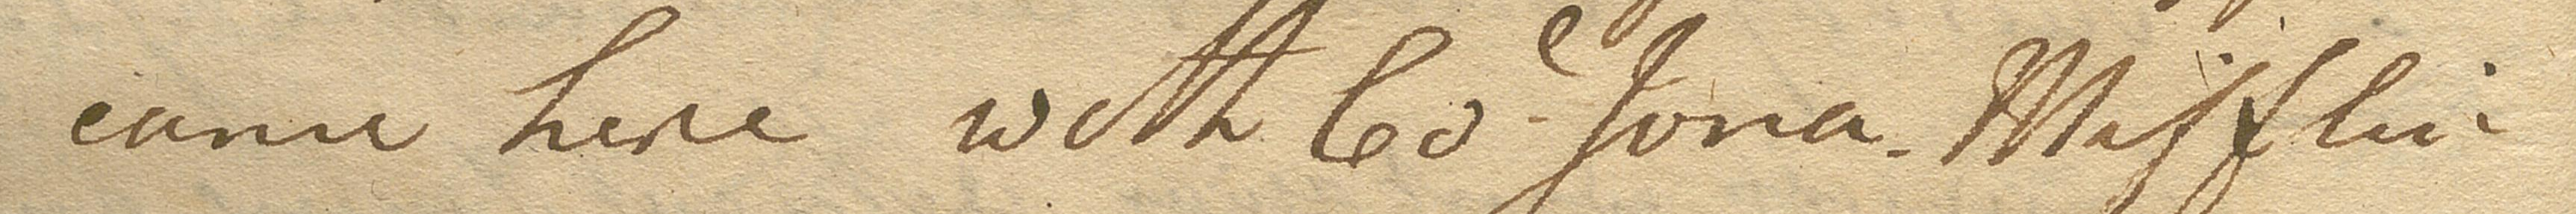came here with Co^l. Jona. Mifflin
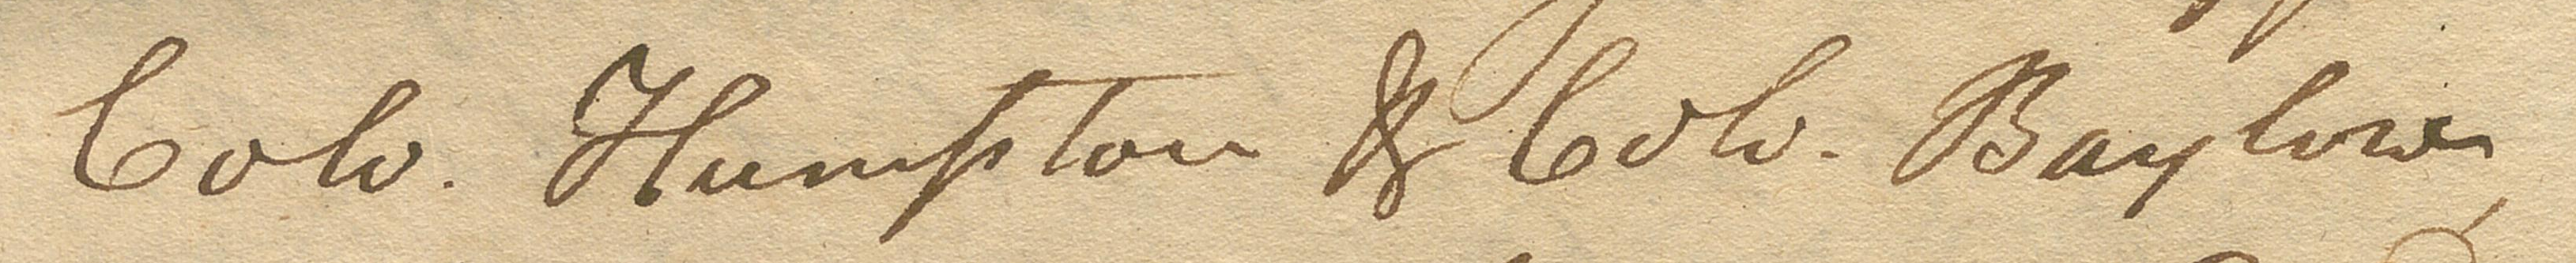Colo. Humpton & Colo. Baylow
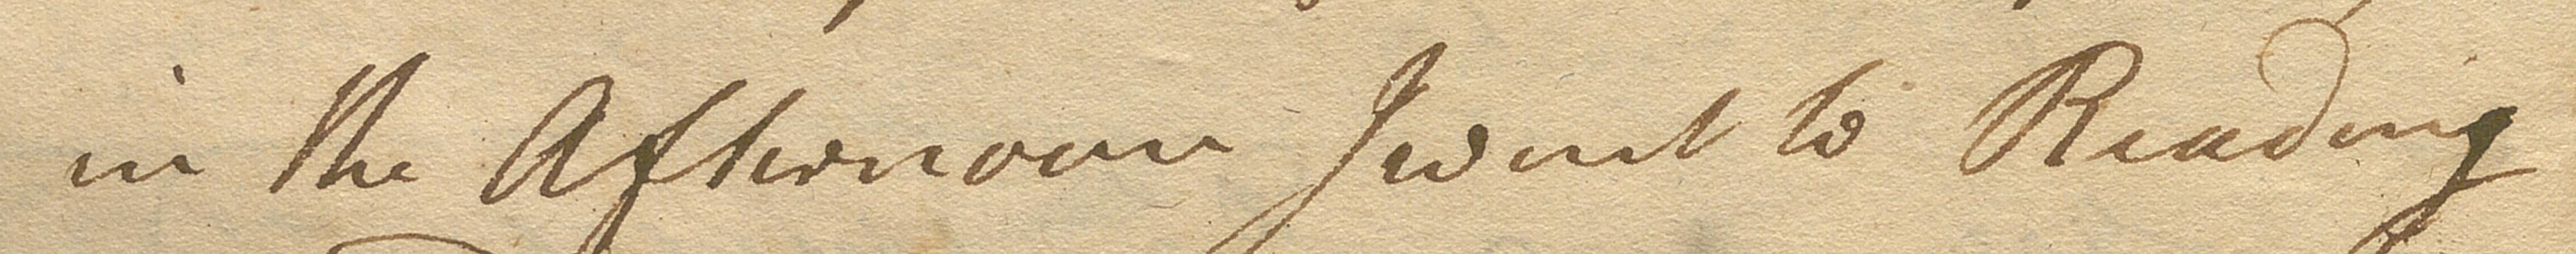in the Afternoon I went to Reading
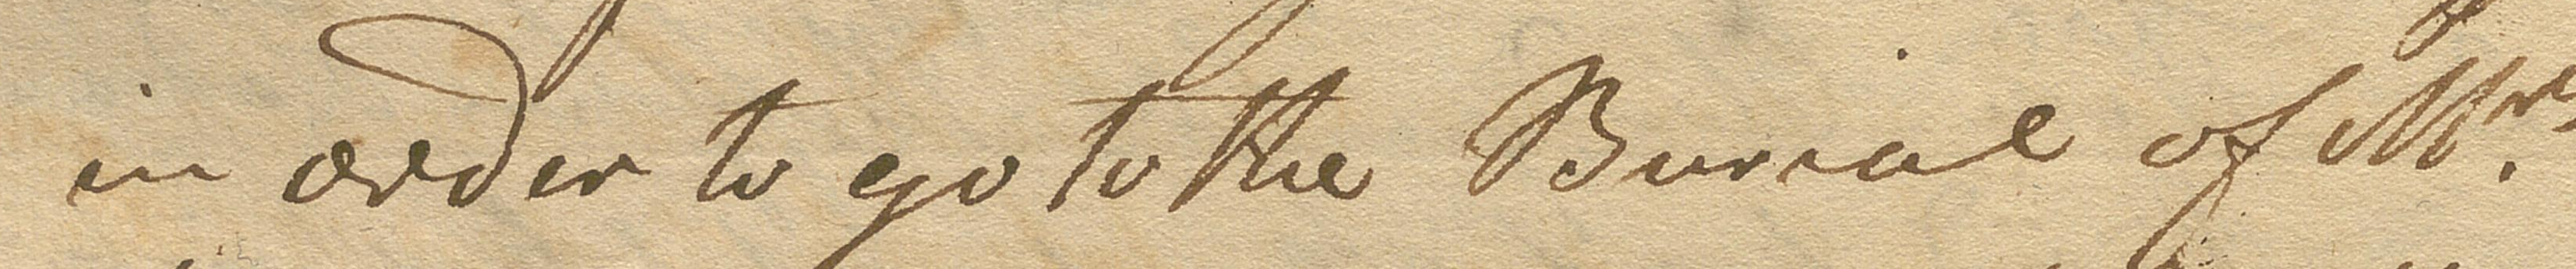in order to go to the Burial of M^rs.
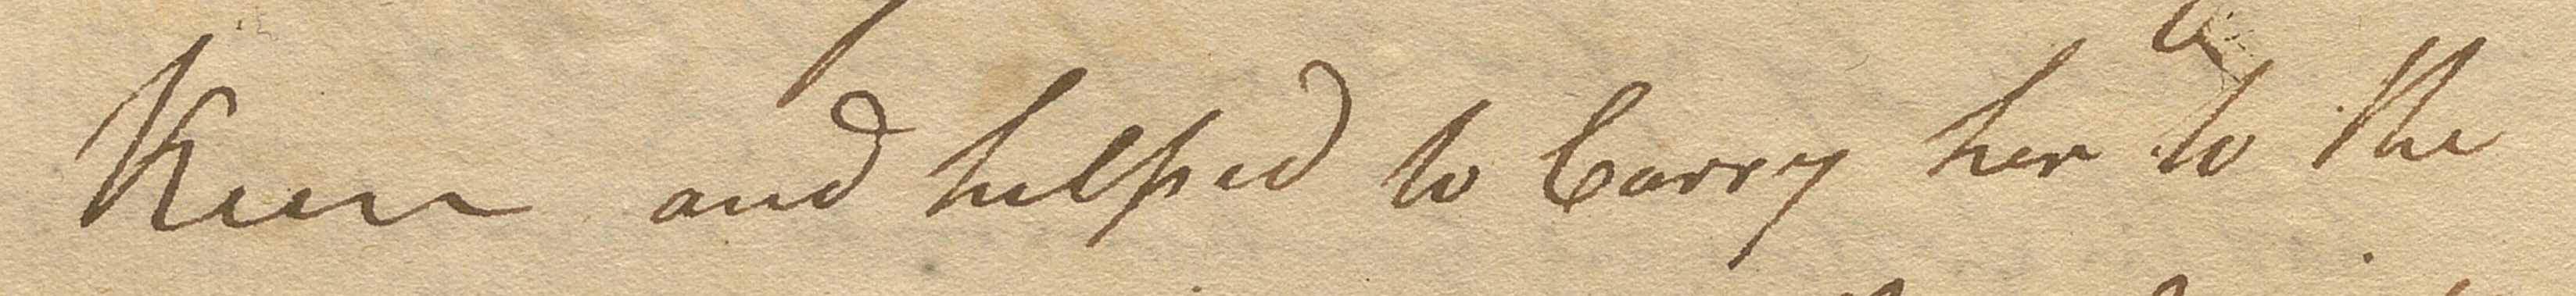Kun and helped to Carry her to the
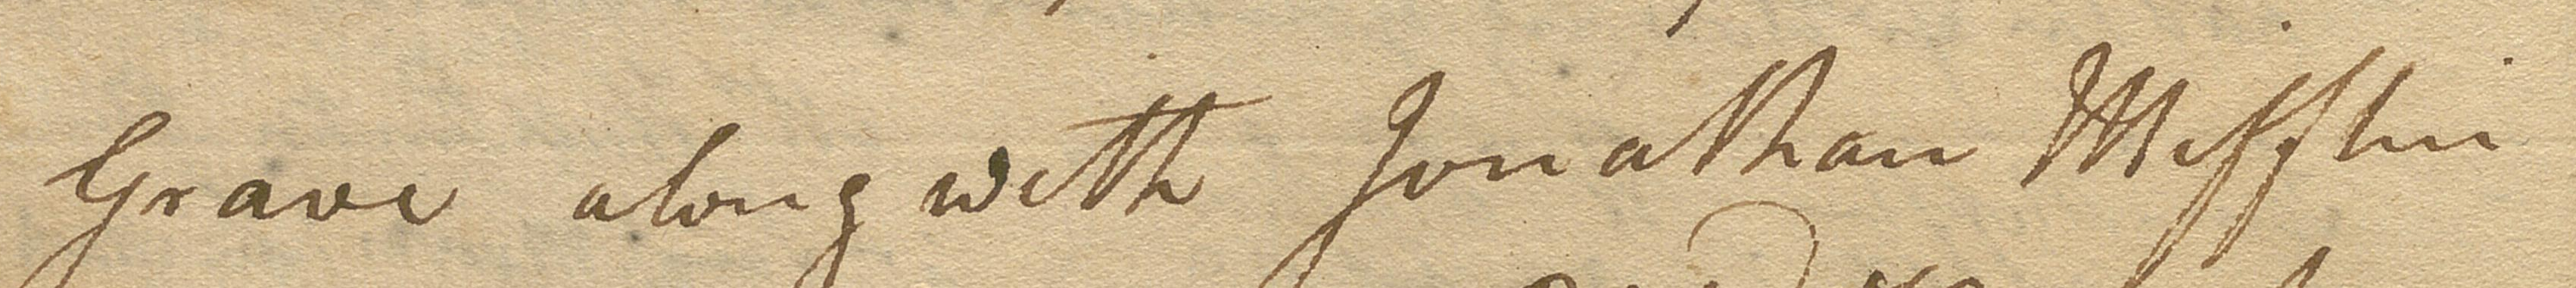Grave along with Jonathan Mifflin
